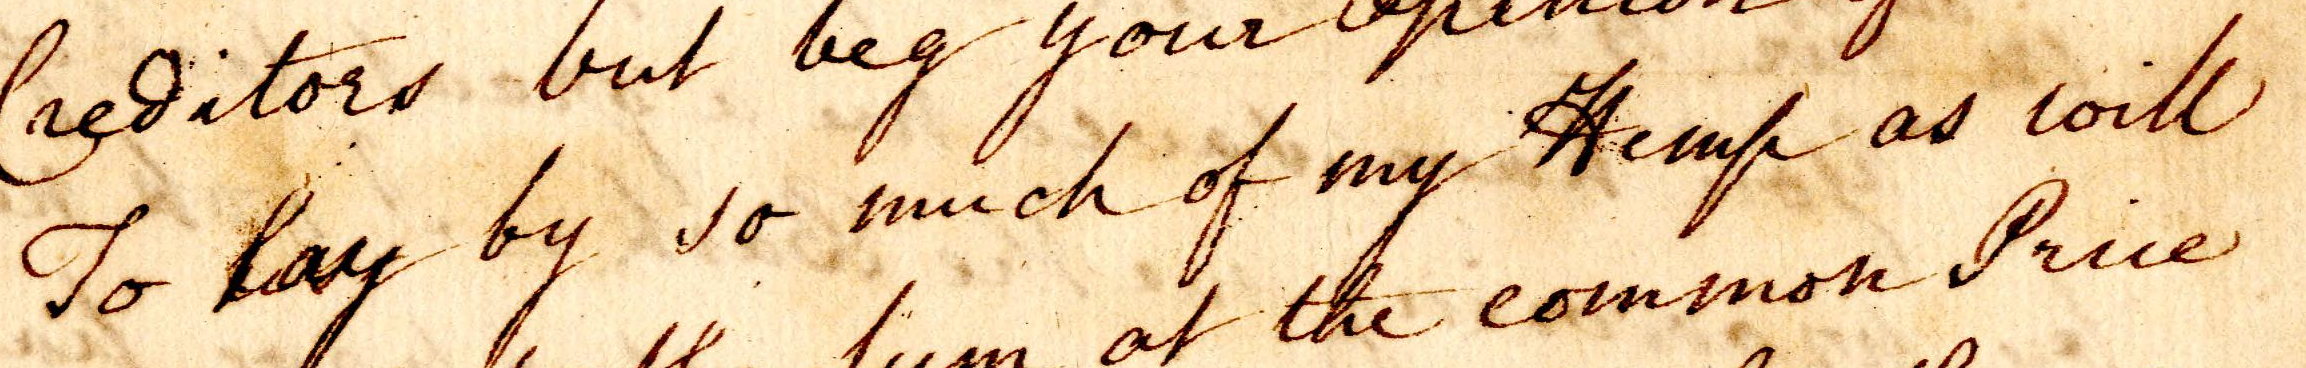To lay by so much of my Hemp as will
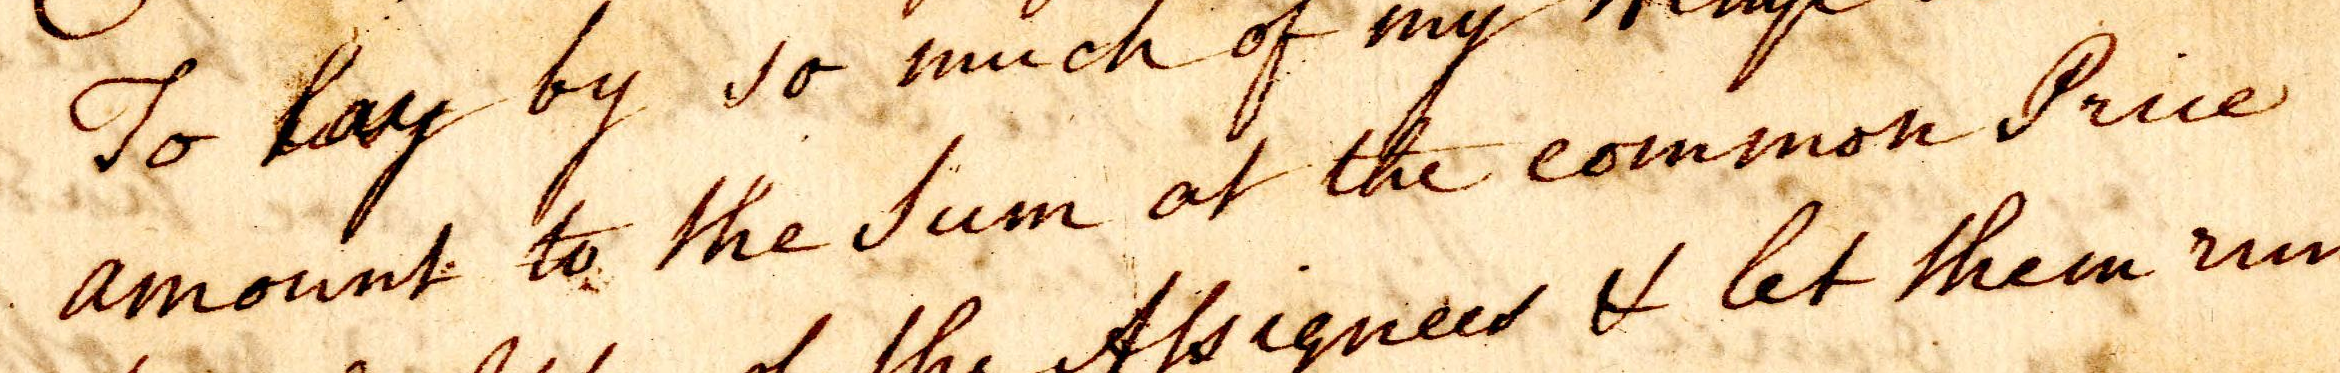amount to the sum at the common Price
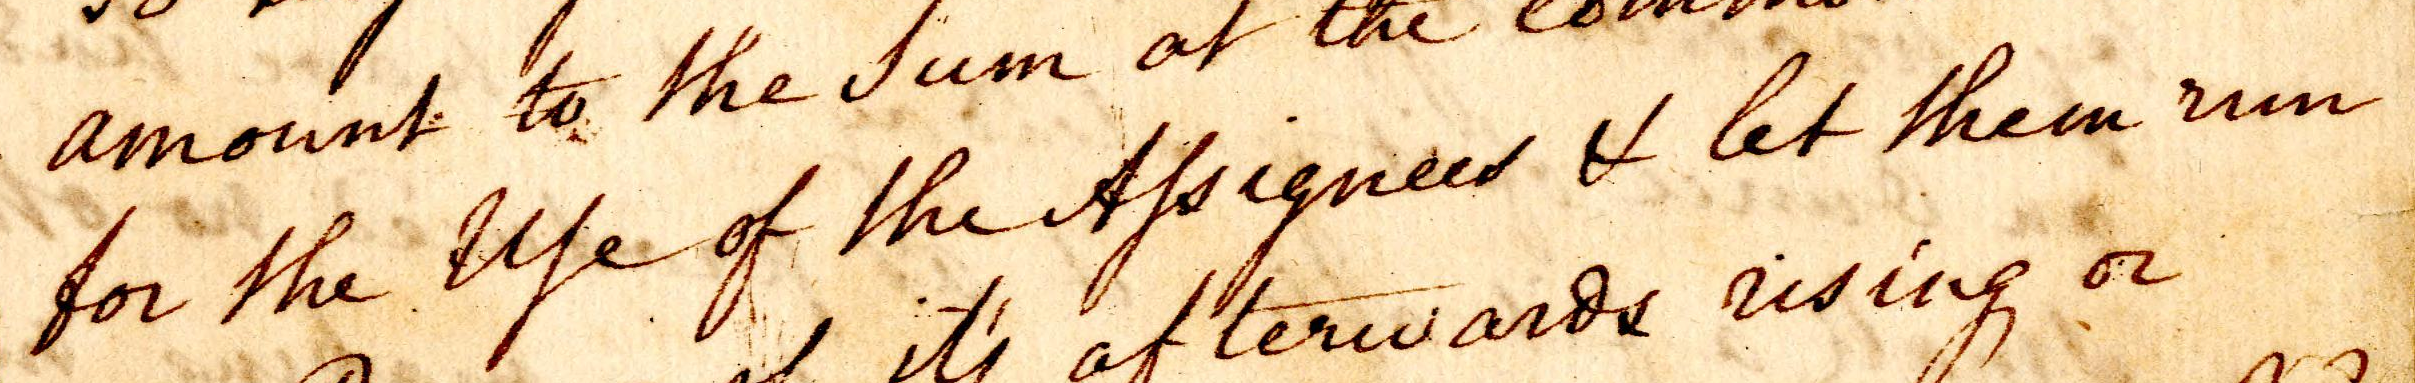for the Use of the Assignees & let them run
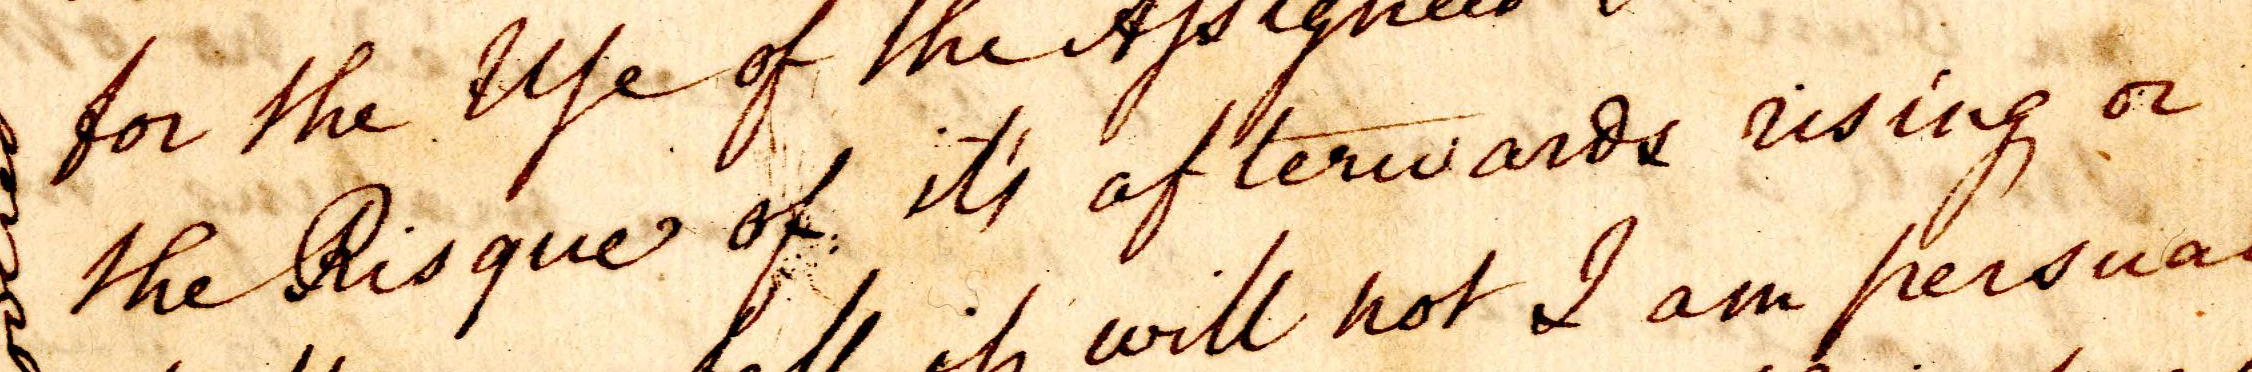the Risque of it's afterwards rising or
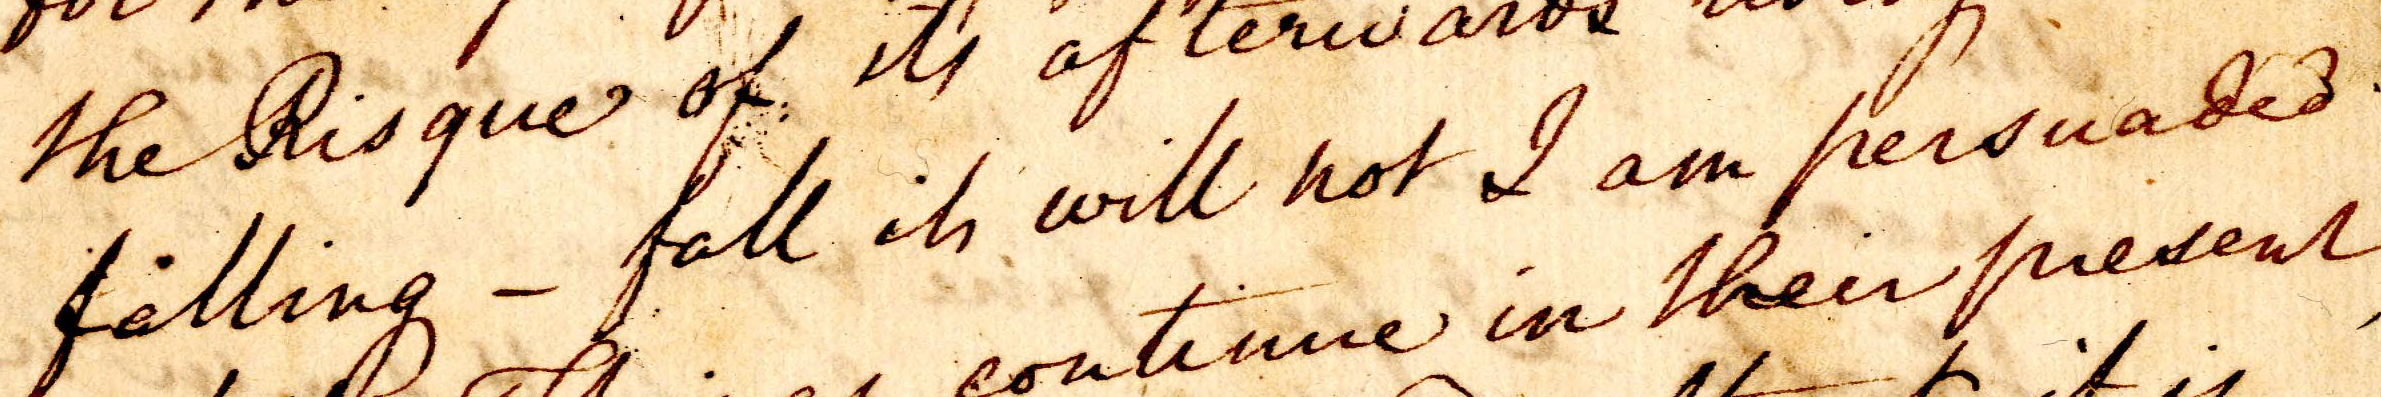falling- fall its will not I am persuaded
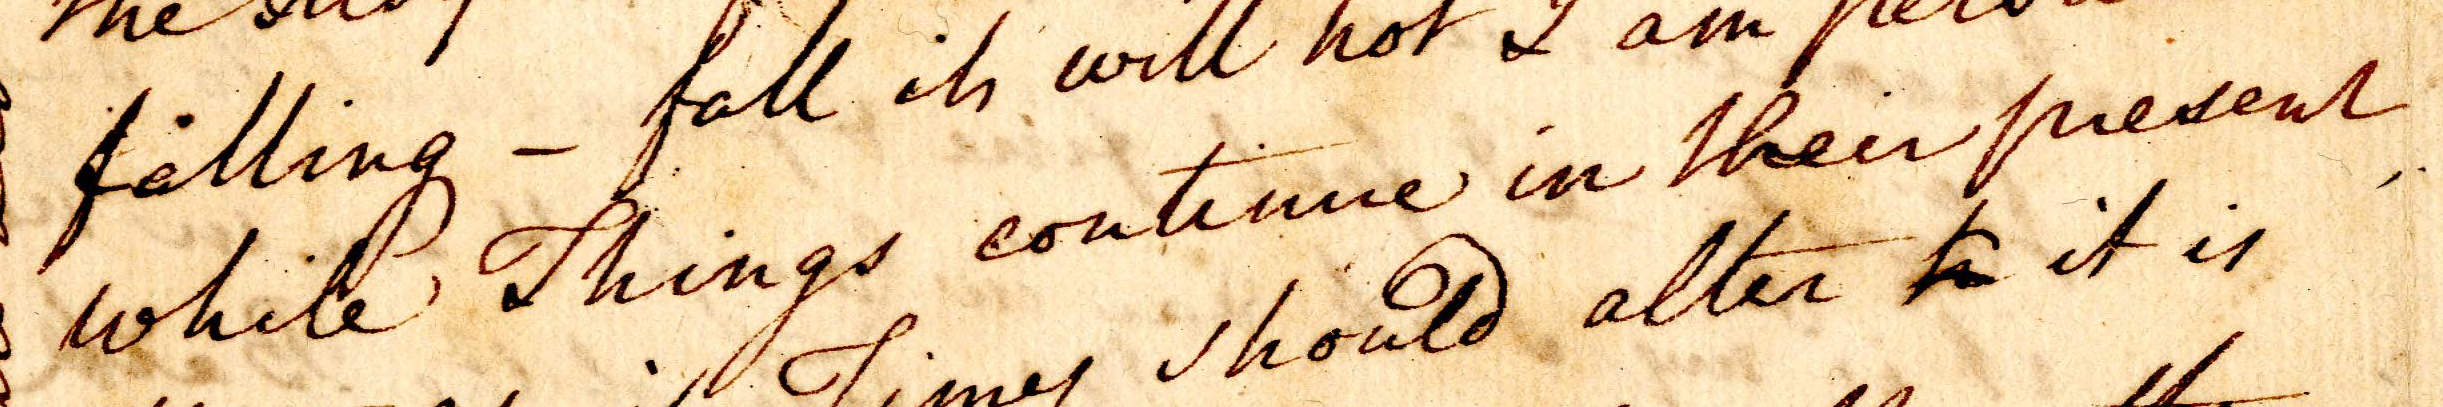while Things continue in their present
